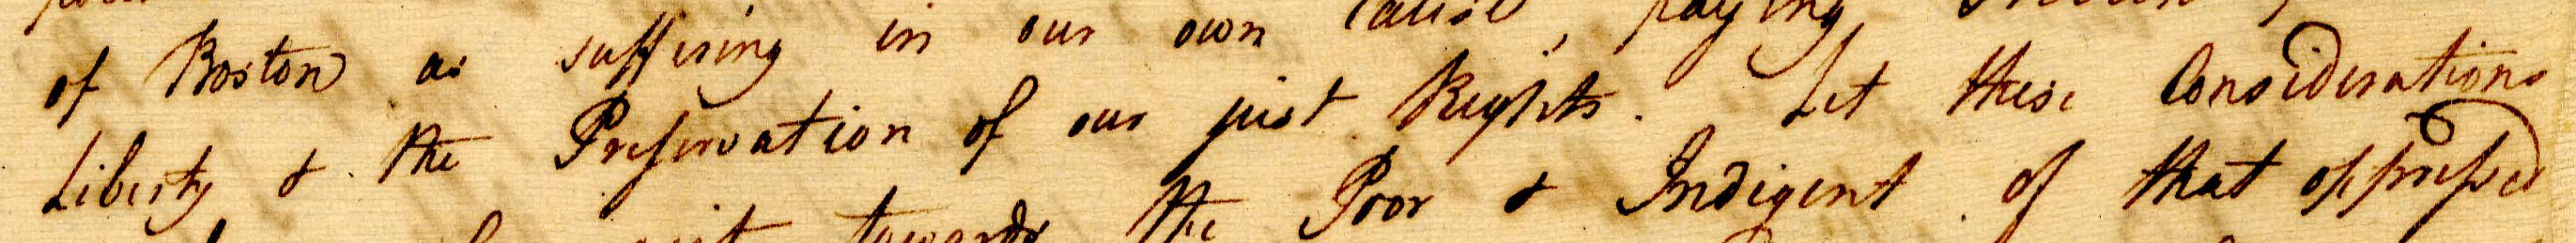Liberty & the Preservation of our just Rights. Let these Considerations
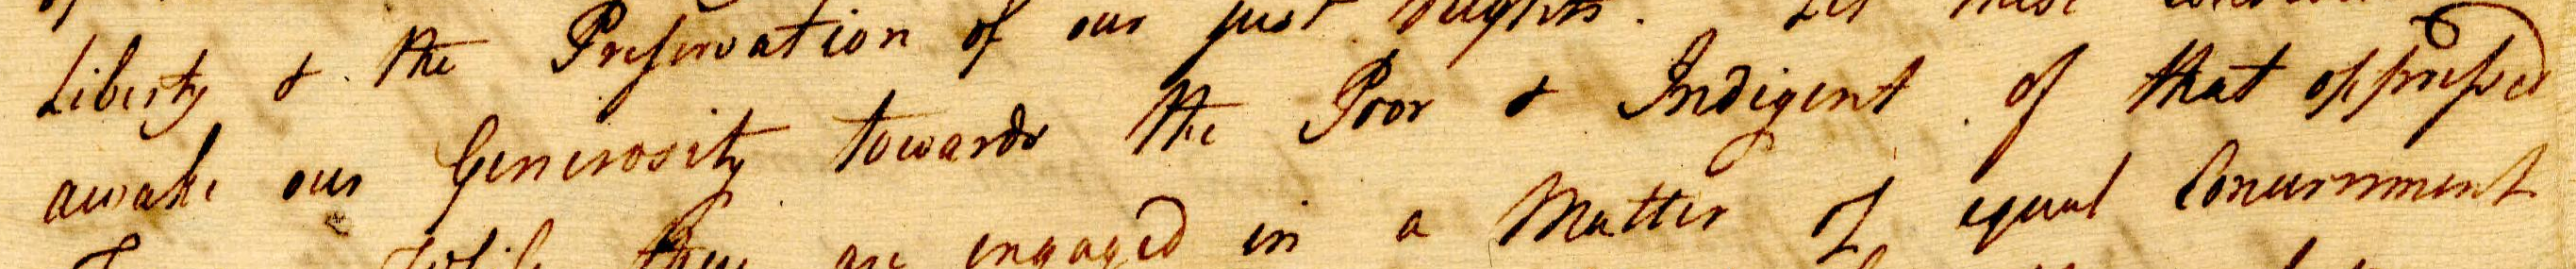awake our Generosity towards the Poor & Indigent of that oppressed
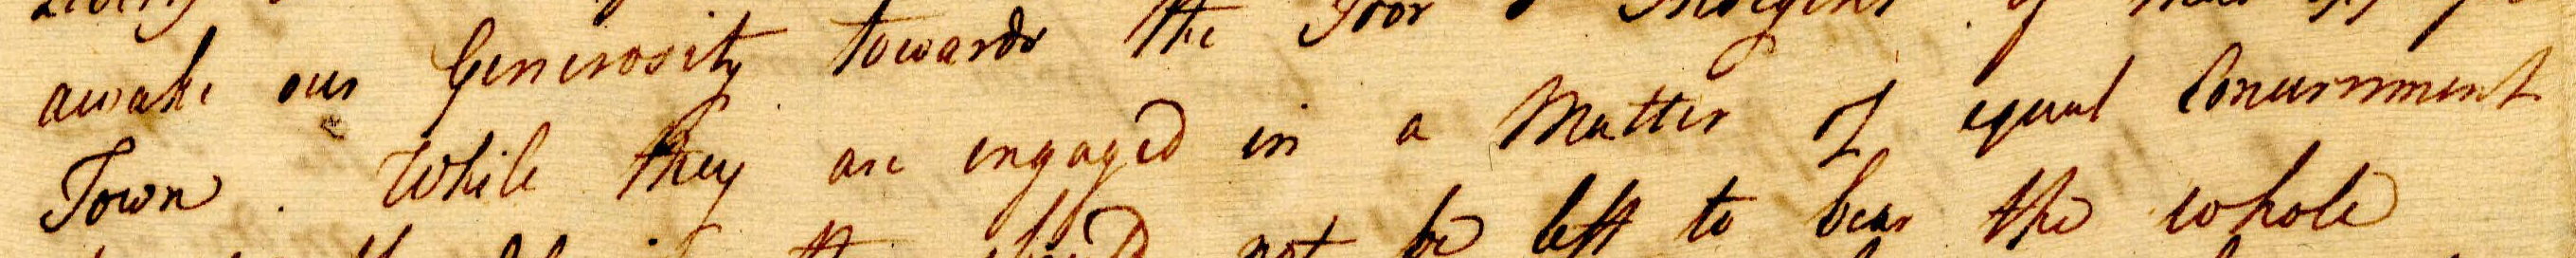Town. While they are engaged in a Matter of equal Conurmment
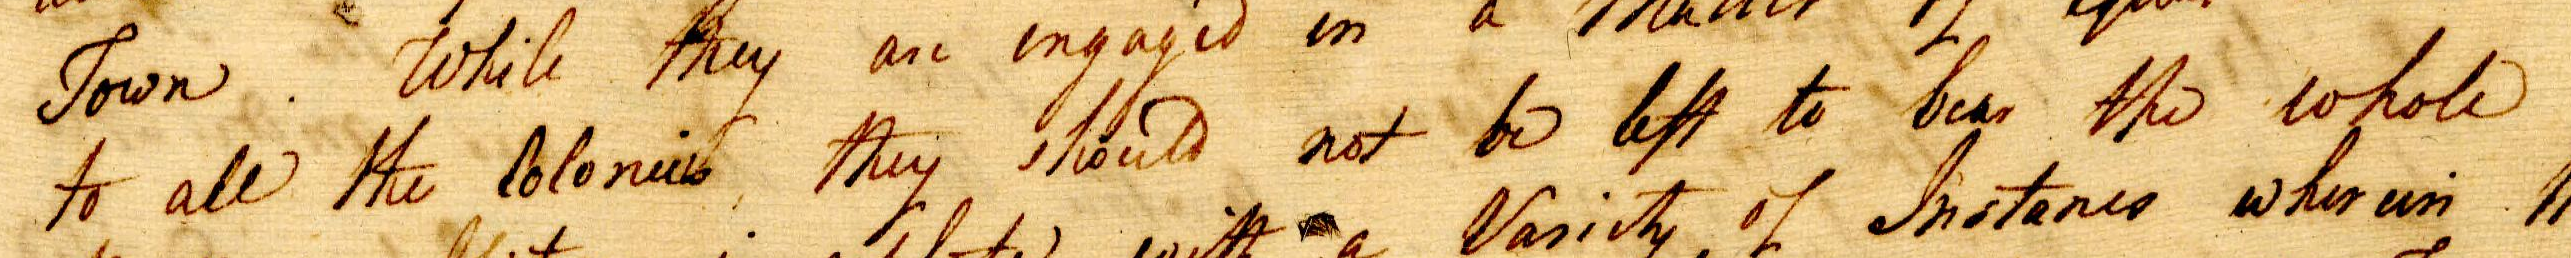to all the Colonies, they should not be left to bear the whole
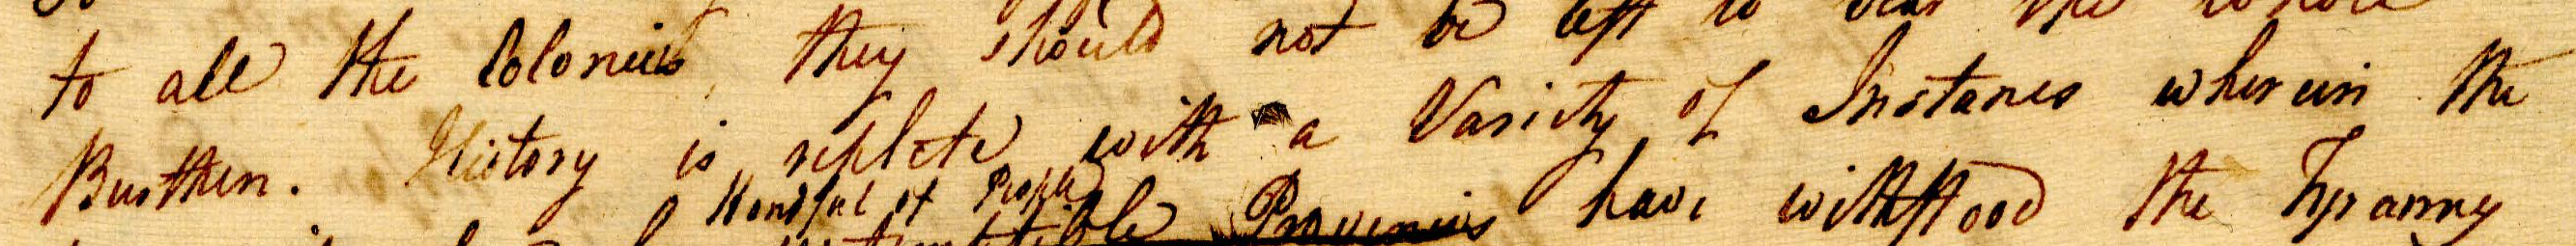Burthen. History is replete with a Variety of Instances wherein the
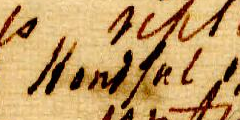Handful of People
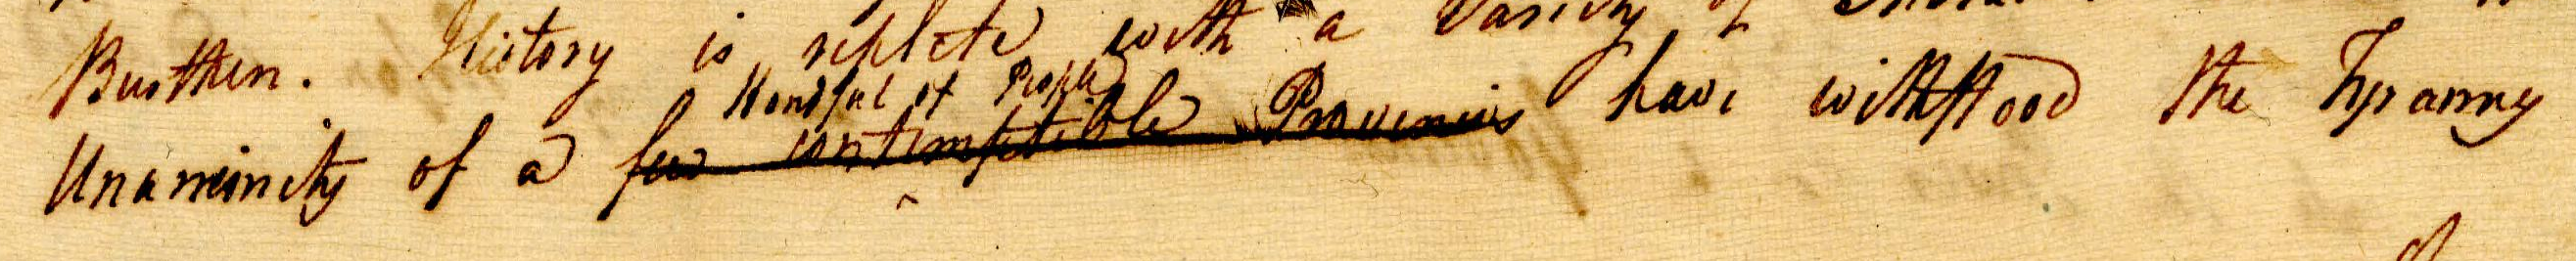Unaminity of a [few contemptible Provinces] ^ have withstood the Tyranny
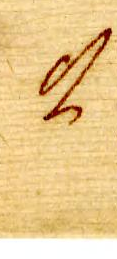of
